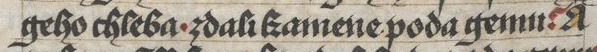geho chleba.zdali kamene poda gemu?A¬
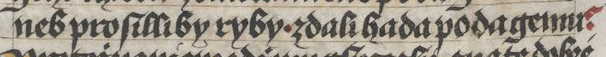neb proſilli by ryby.zdali hada poda gemu?
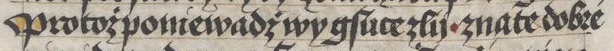Protoż poniewadż vy gſuce zlij.znate dobré
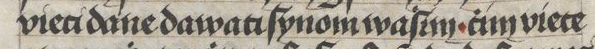vieci dane dawati ſynom waſim.ċím víece
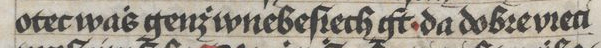otec waṡ genż wnebeſiech ḡt.da dobre vieci
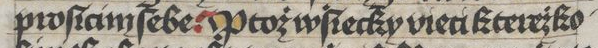proſicim ſebe?Ꝓtoż wẛliecky vieci ktereżko
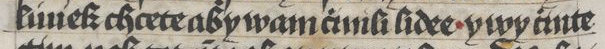liuiek chcete aby wam lidee.ywy ċinte
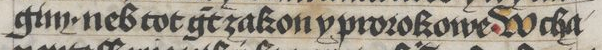gim.Meb tot ḡt zakon y prorokowe.W cha¬
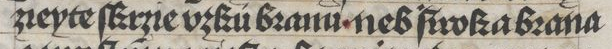zieyte ſkrzie vzkú branu.neb ẛiroka brana
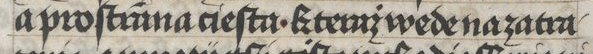a proſtrana cieſta.kteraż wede na zatra¬
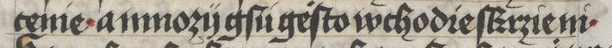teníe.a mnozij gſú geẛto wchodíe ſkrzie ni.
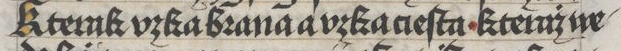A kterak vzka brana a vzka cieſta.kteraż we¬
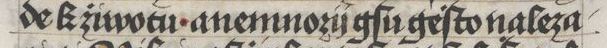de k żiwotu.anemnozij gſu geẛto naleza¬
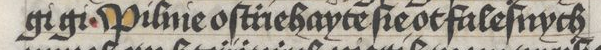gi gi.Pilnie oſtṙíehayte ſie ot faleẛnych
